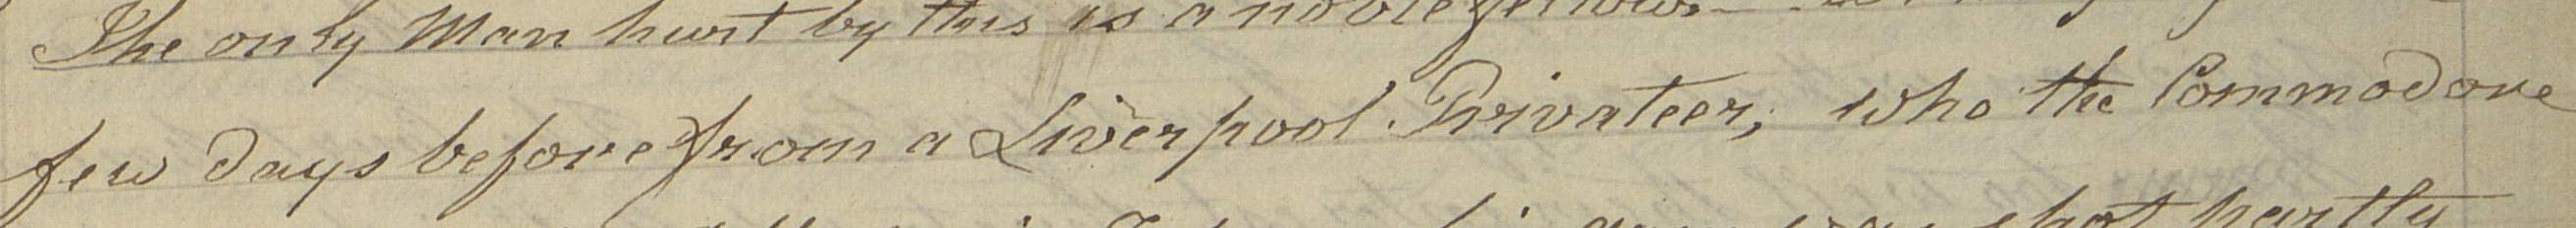few days before from a Liverpool Privateer, who the Commodore
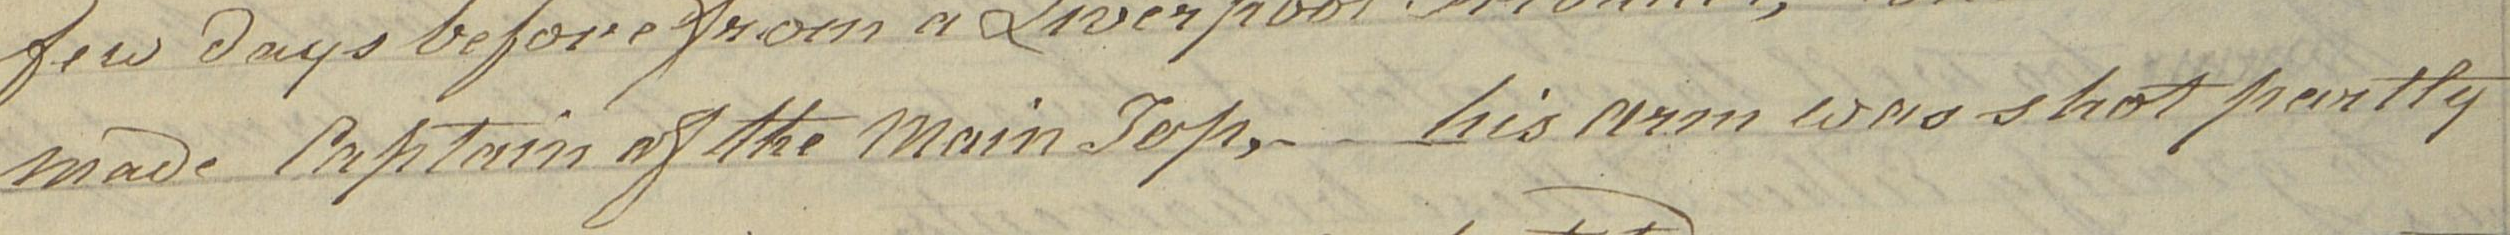made Captain of the Main Top, his arm was shot partly
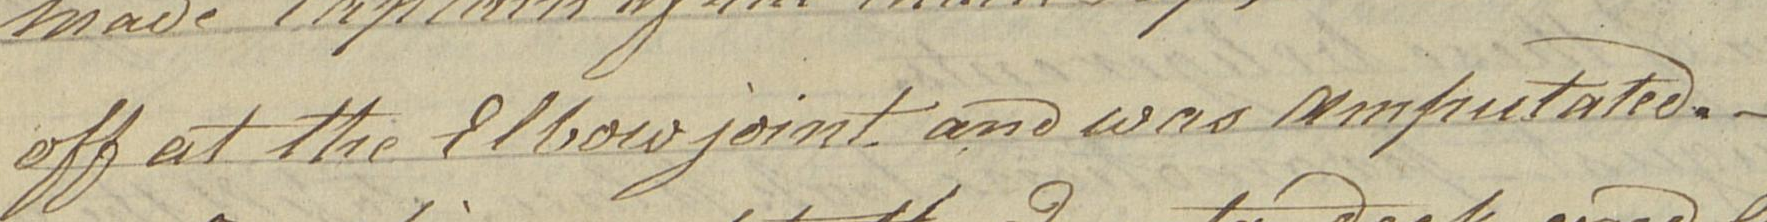off at the Elbow joint and was amputated.
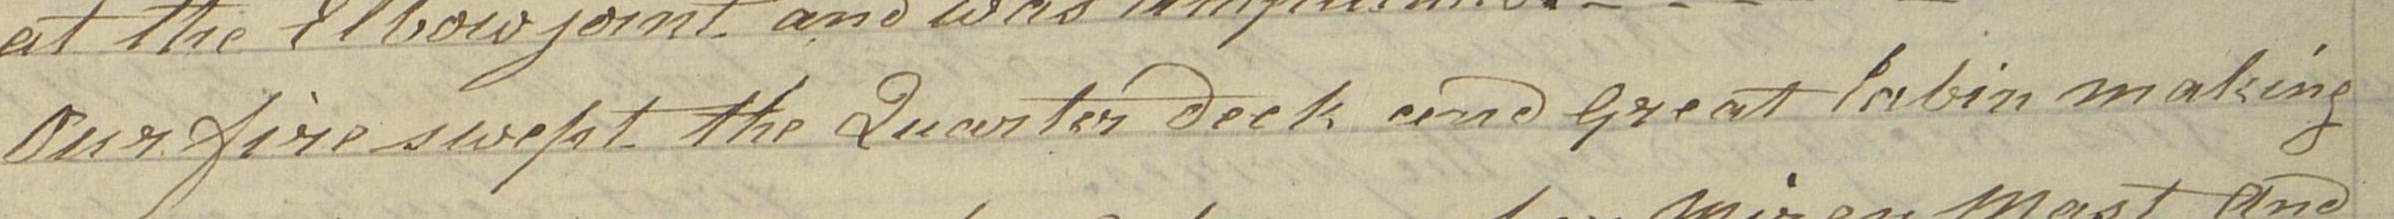our fire swept the Quarter deck andd Great Cabin making
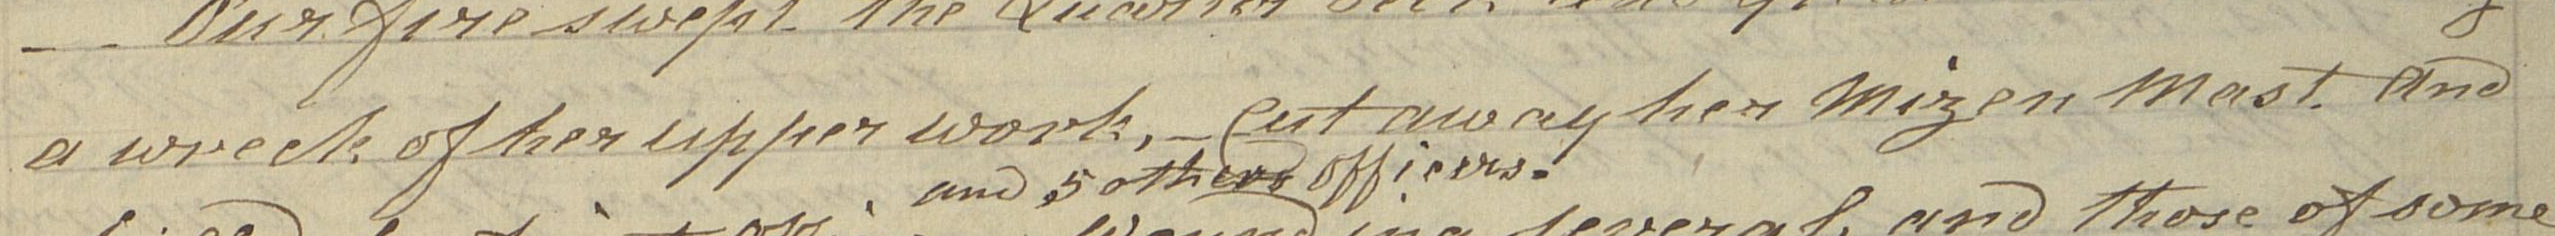a wreck of her upper work, cut away her Mizen mast and
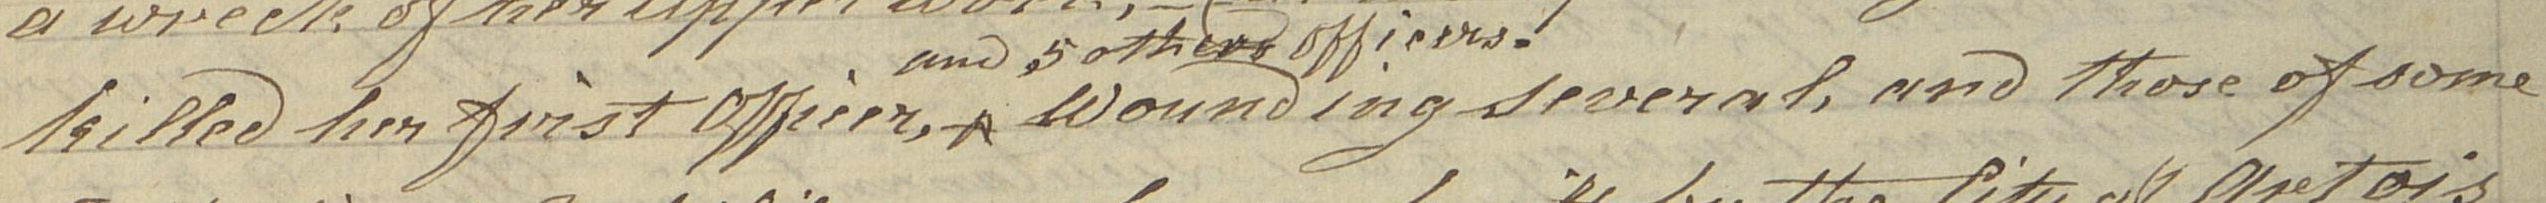Killed hen first Officer ^ wounding several and those of some
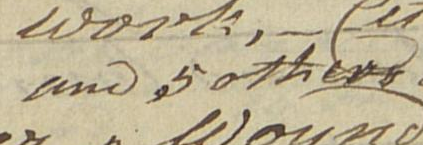and 5 others
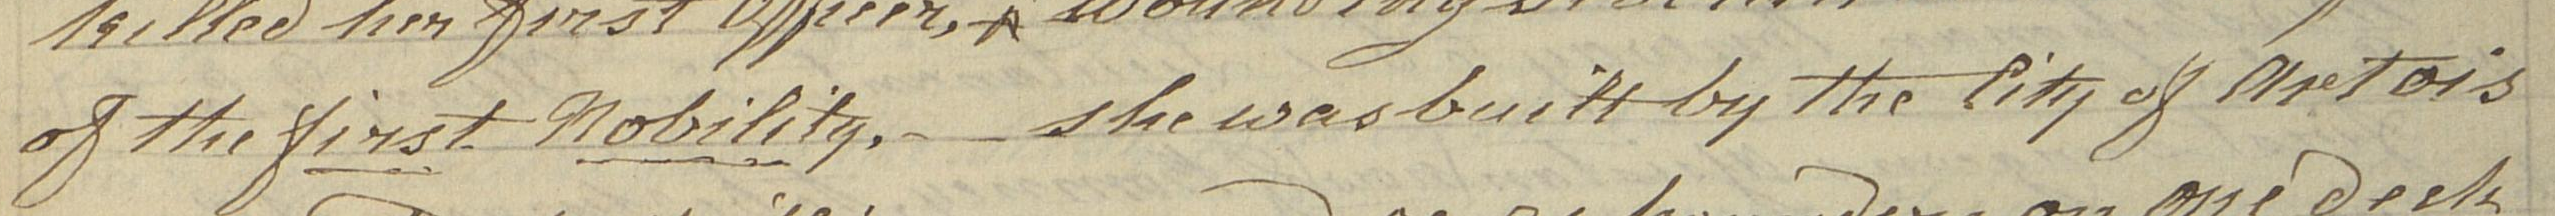of the first nobility, she was built by the City of Artois
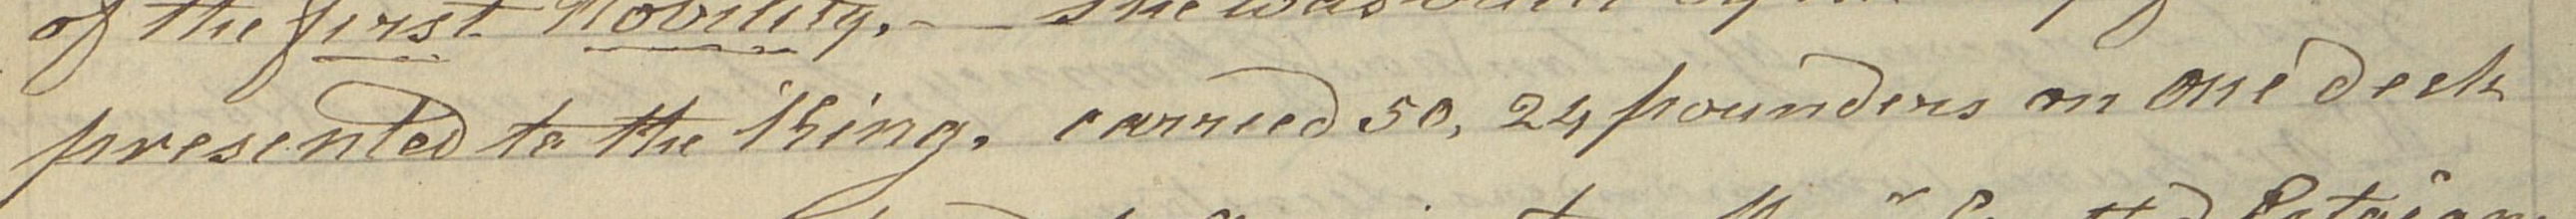presented to the King, carried 50, 24 pounders on one deck
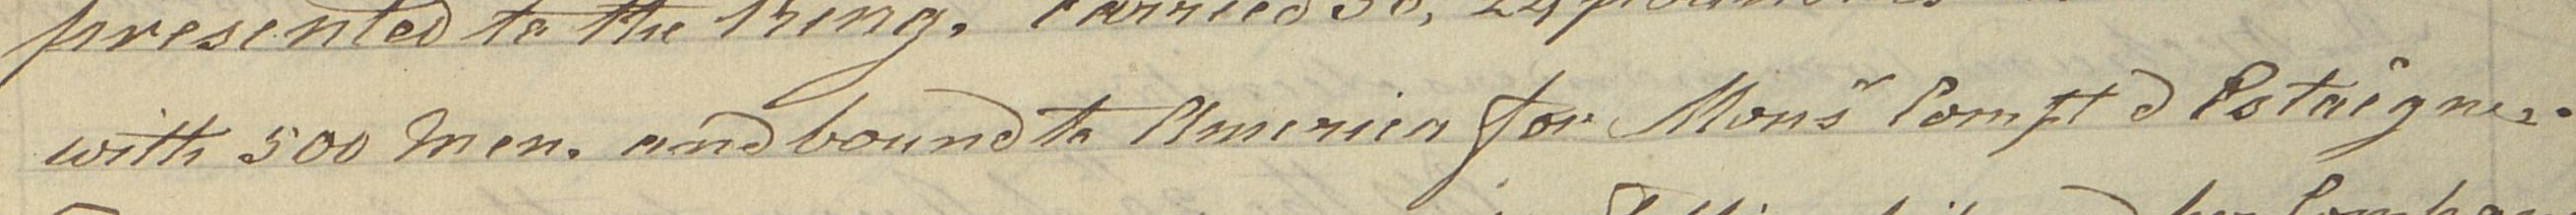with 500 men. and bound to America for Mons^r. Comptd Estaignes
